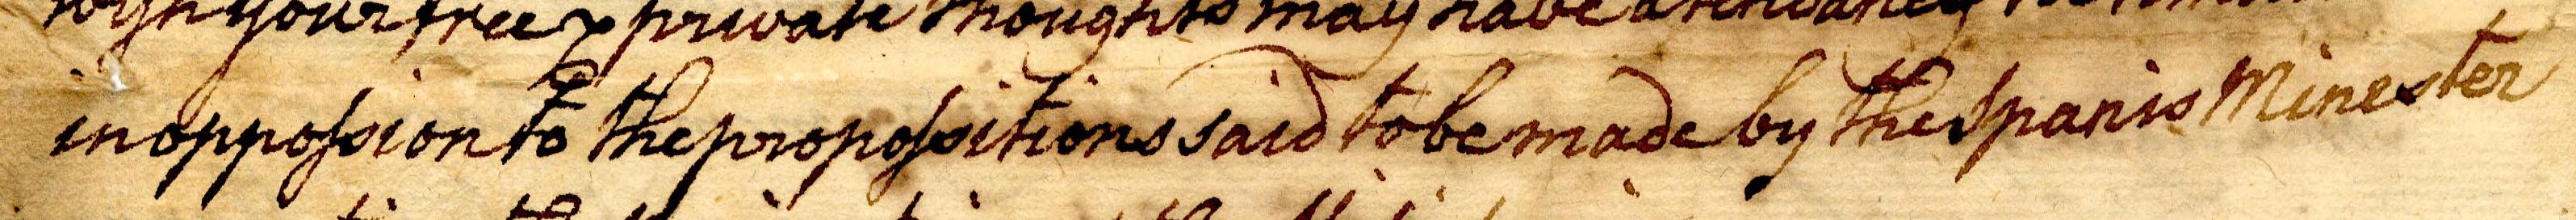in oppossion to the propossitions said to be made by the Spanis Minester
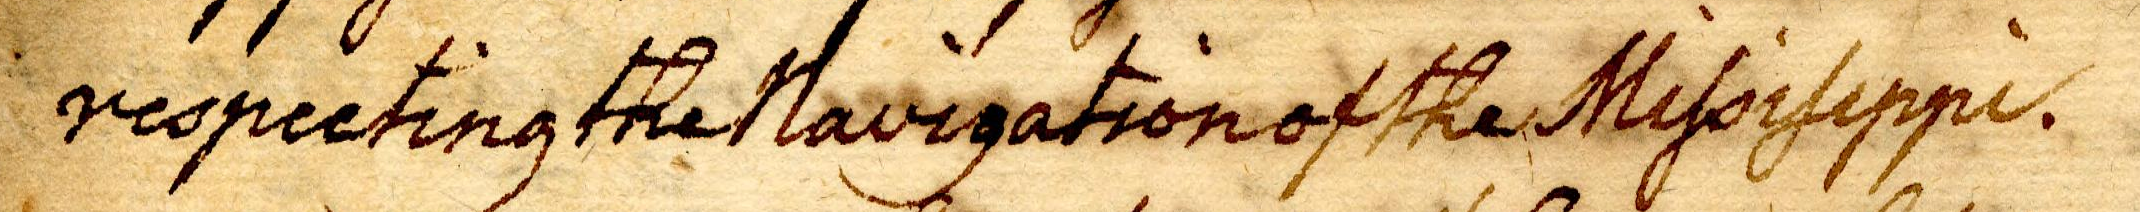respecting the Navigation of the Missisippi.
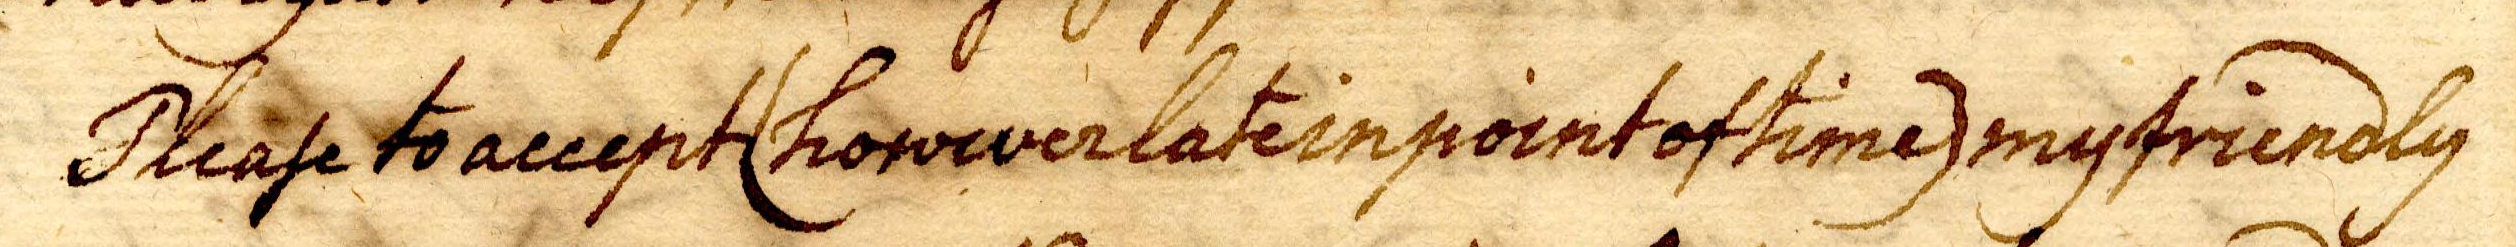Please to accept (however late in point of time) my friendly
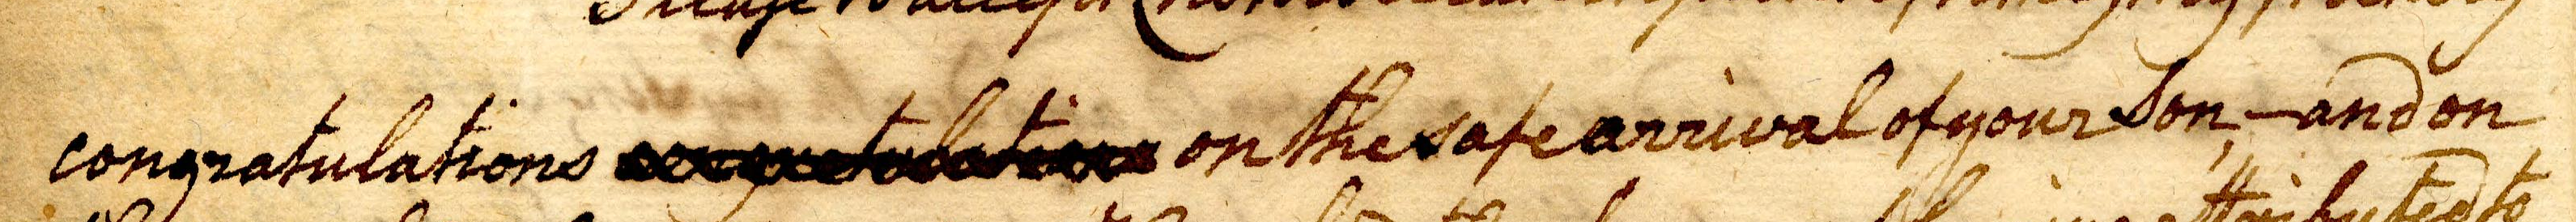congratulations [___________] on the safe arrival of your son,- and on
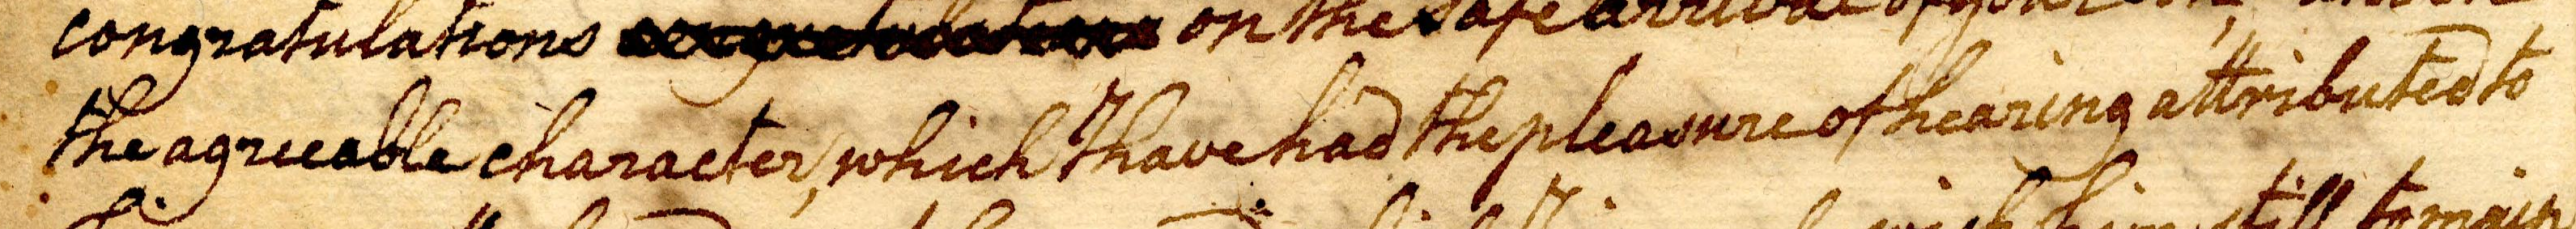the agreeable character, which I have had the pleasure of hearing attributed to
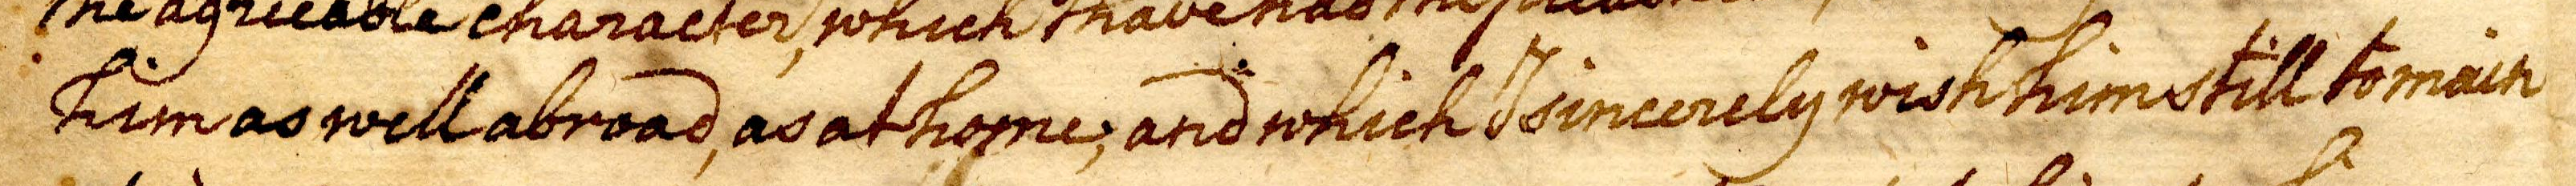him as well abroad, as at home; and which I sincerely wish him still to main
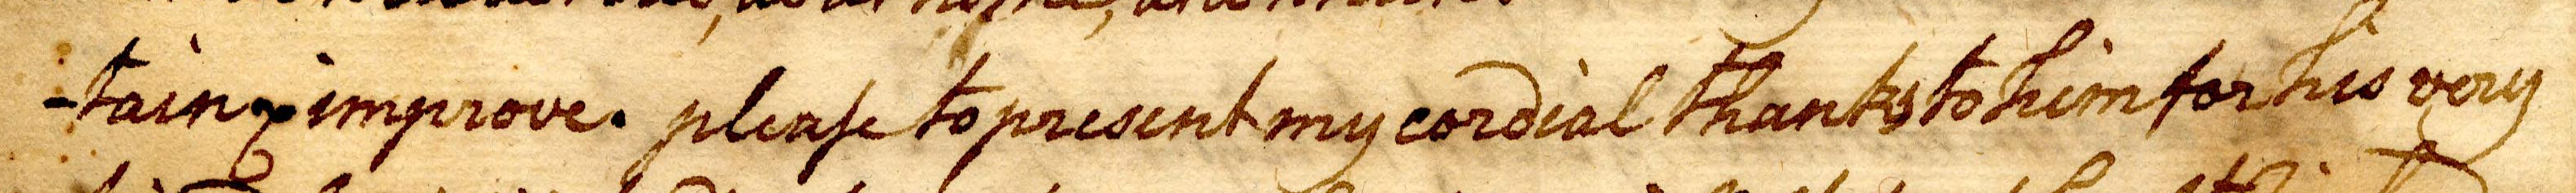-tain & improve. please to present my cordial thanks to him for his very
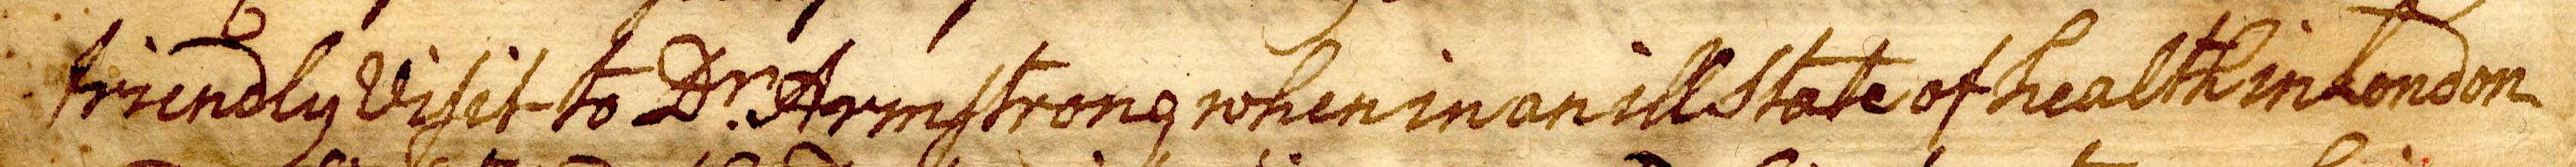friendly Visit to D^r. Armstrong when in an ill state of health in London
